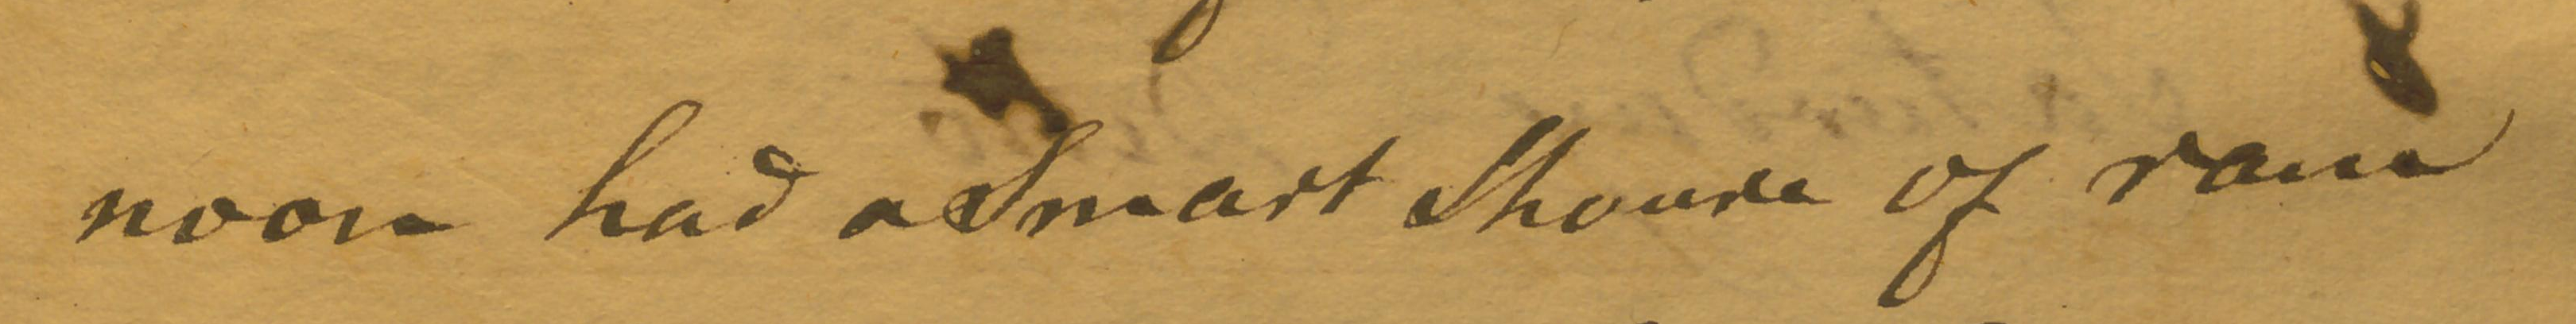noon had a smart Shoure of raine
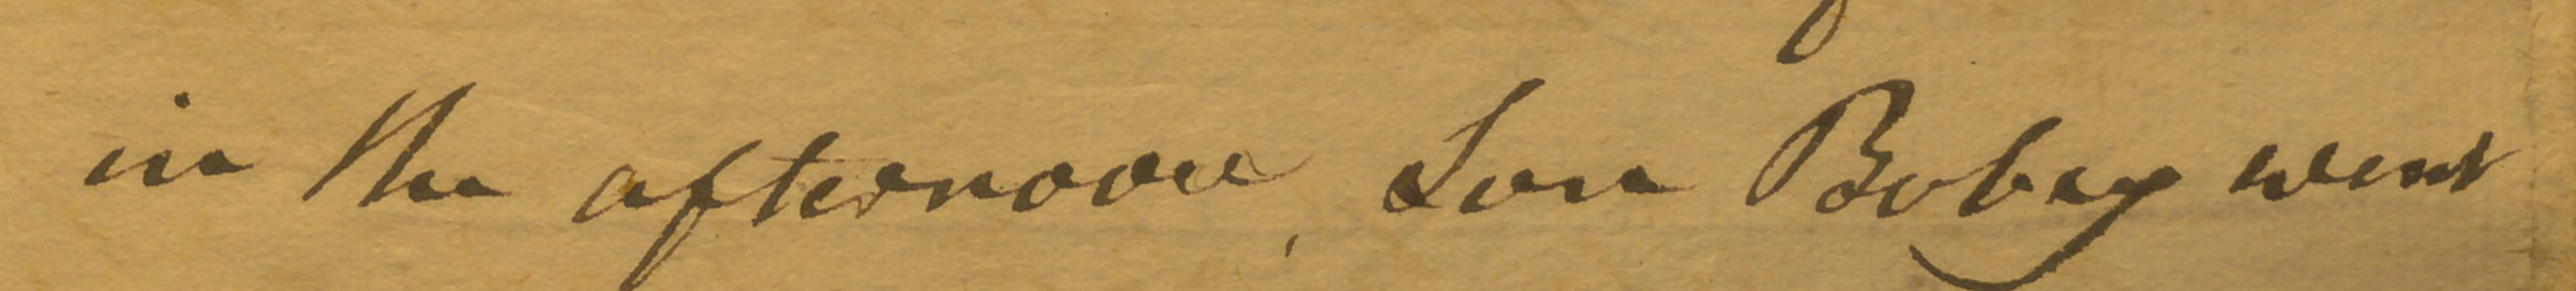in the afternoon son Bobey went
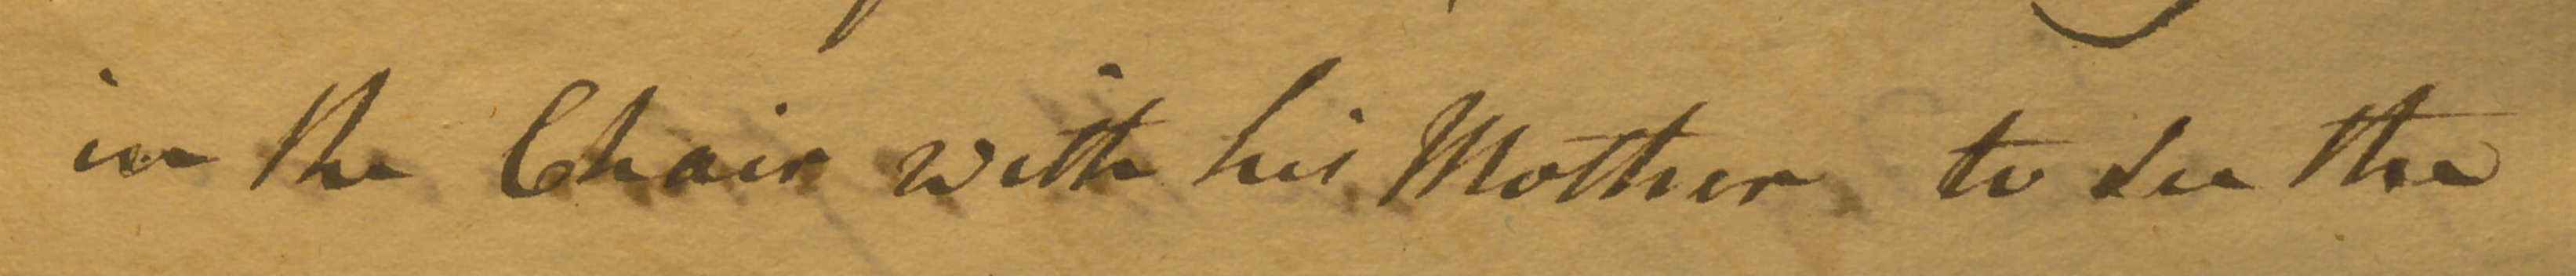in the Chair with his Mother to see the
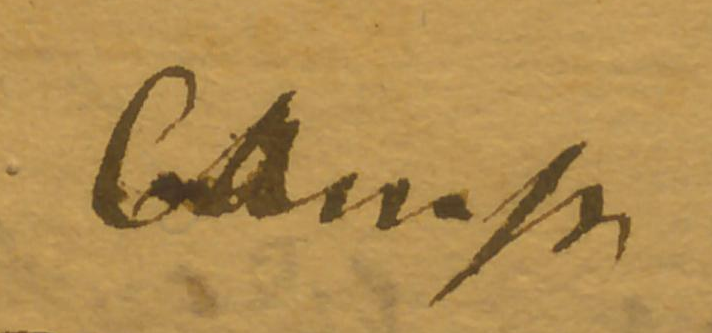Camp
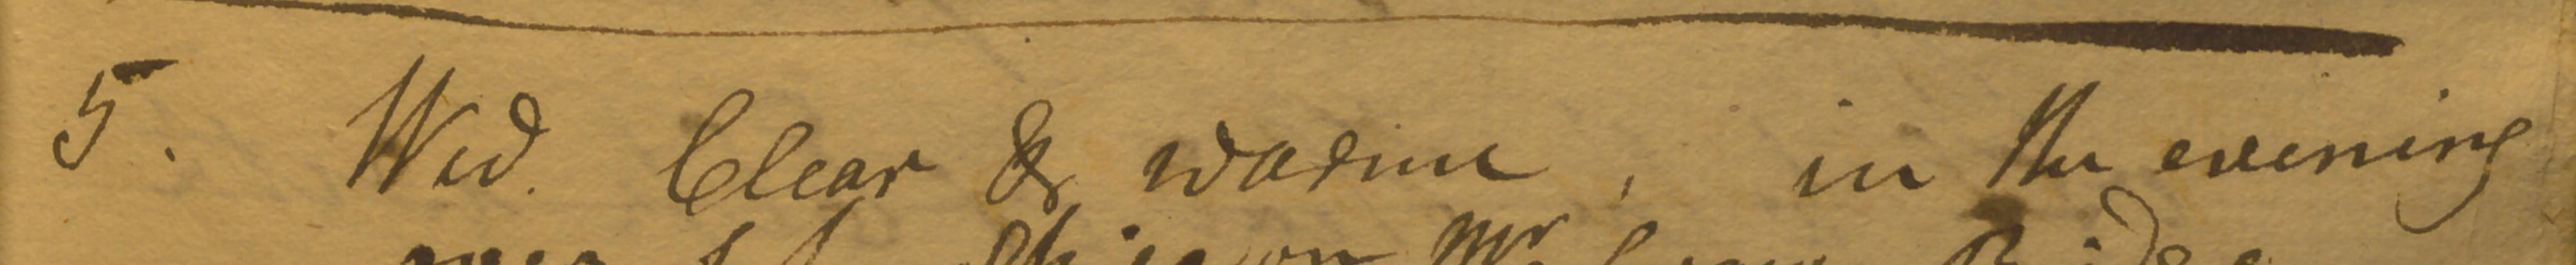5. Wed. Clear & warme, in the evening
